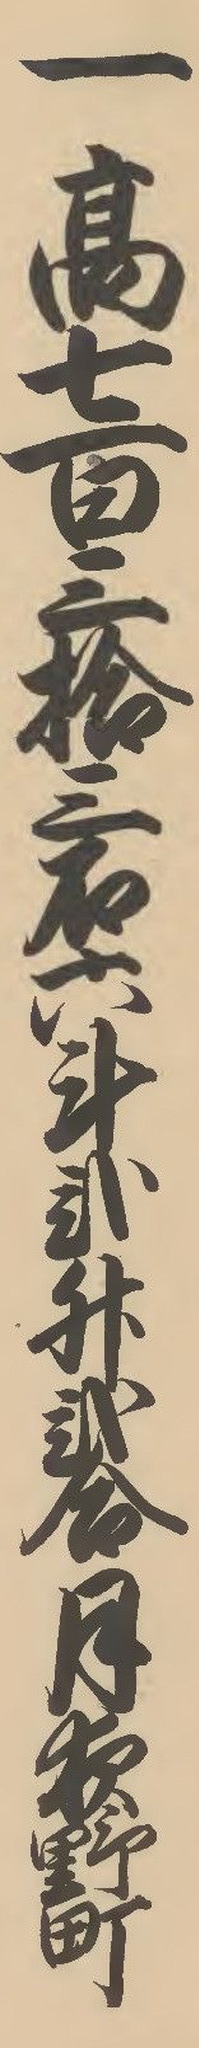一髙七百三拾三石六斗弐升弐合月夜野町
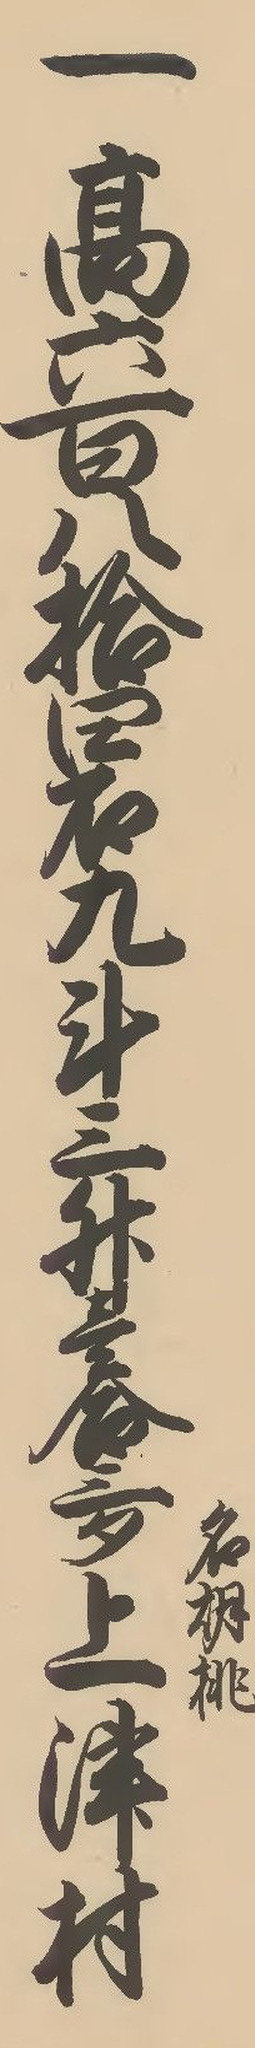一髙六百八拾四石九斗三升壱合三夕上津村
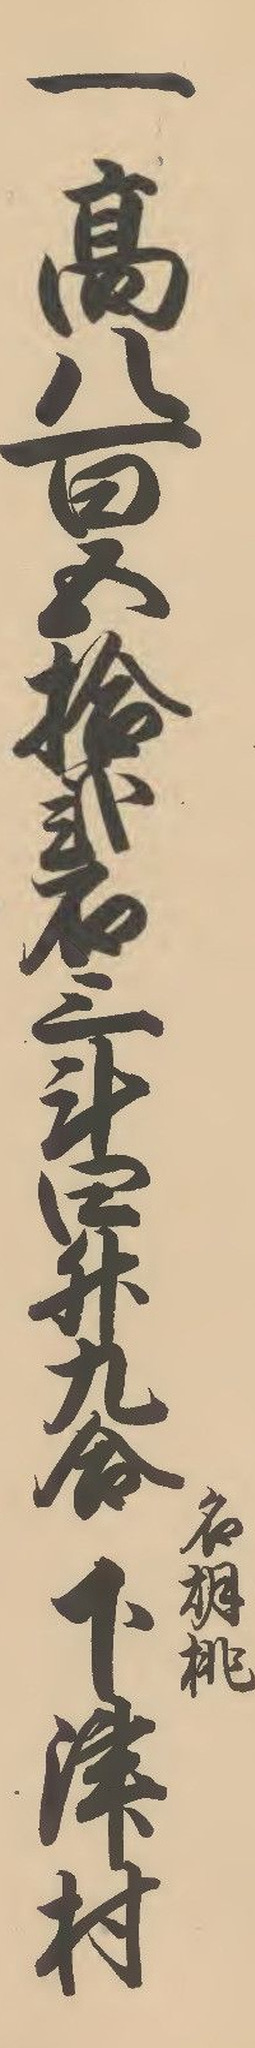一髙八百五拾弐石三斗四升九合下津村
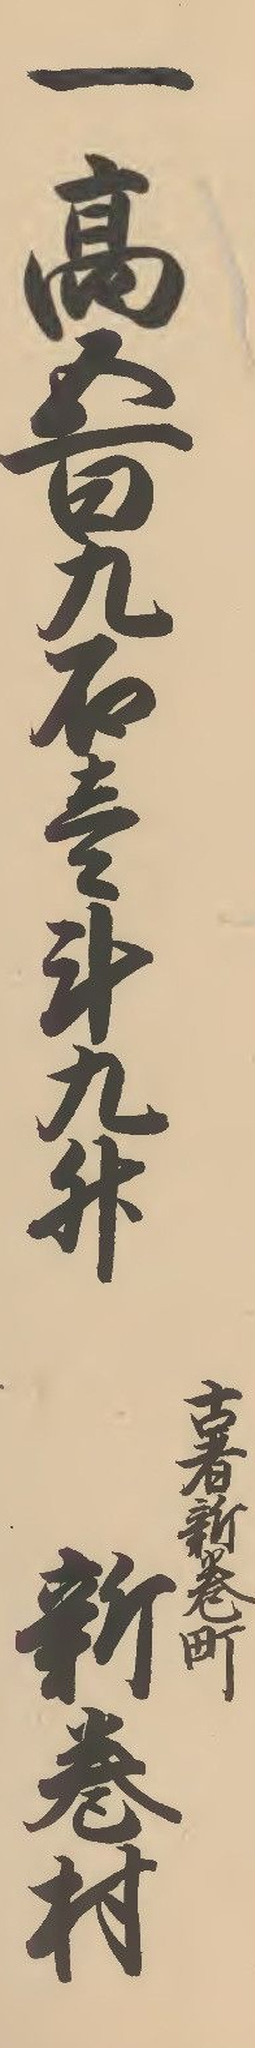一髙五百九石壱斗九升新巻村
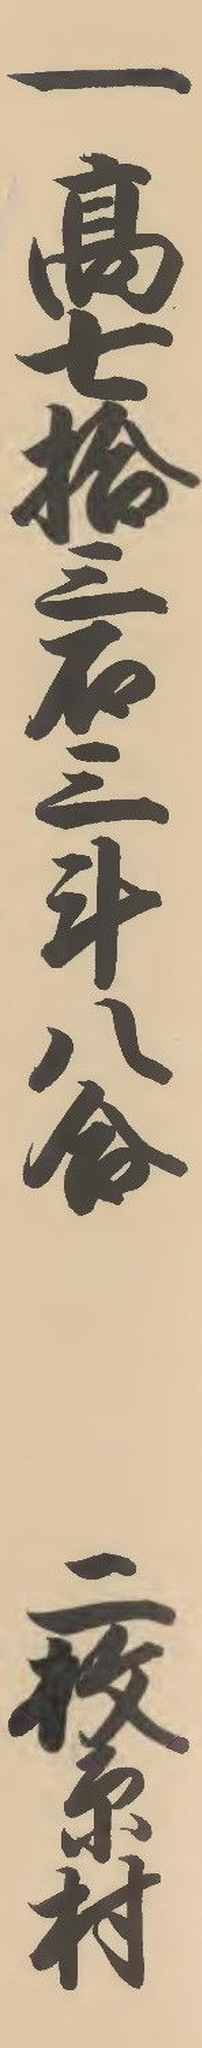一髙七拾三石三斗八合二枚原村
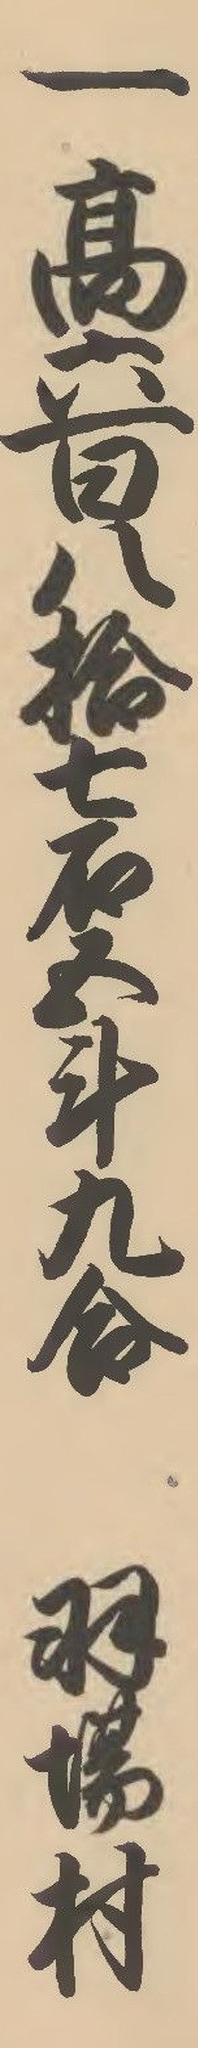一髙六百八拾七石五斗九合羽場村
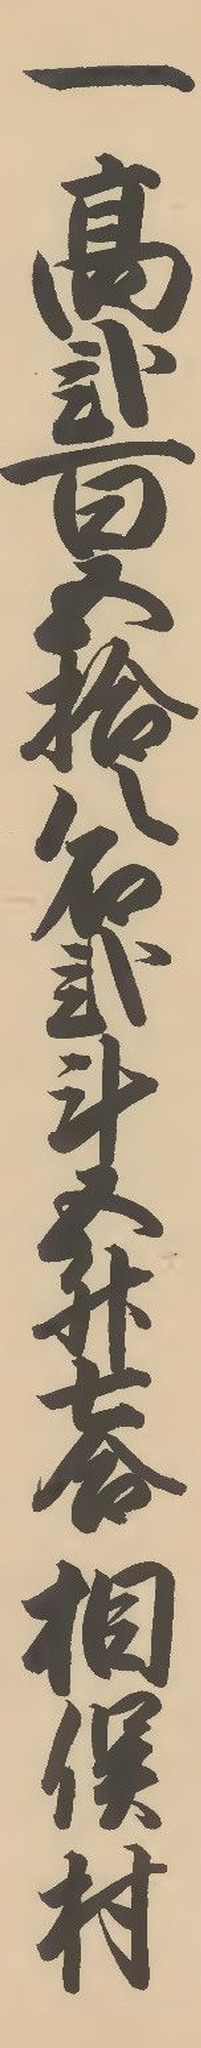一髙弐百五拾八石弐斗五升七合相俣村
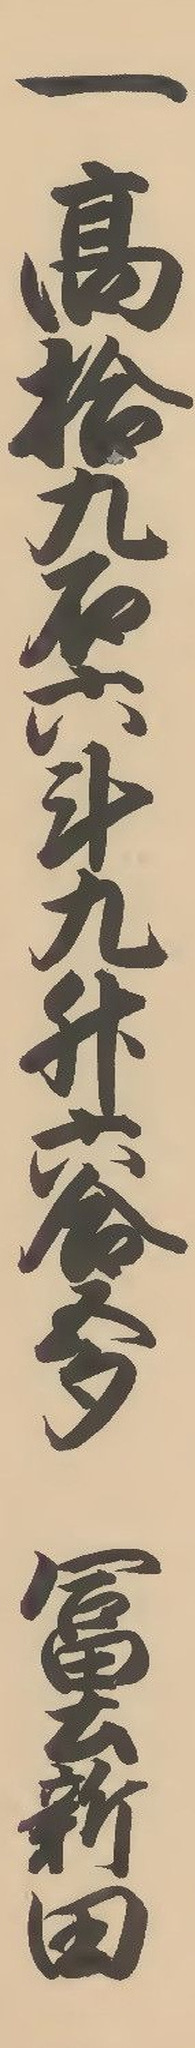一髙拾九石六斗九升六合五夕冨土新田

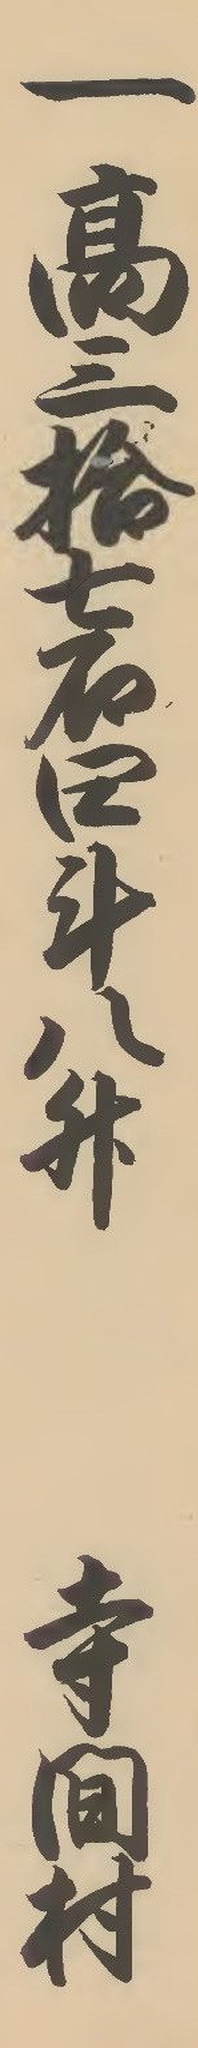一髙三拾七石四斗八升寺間村
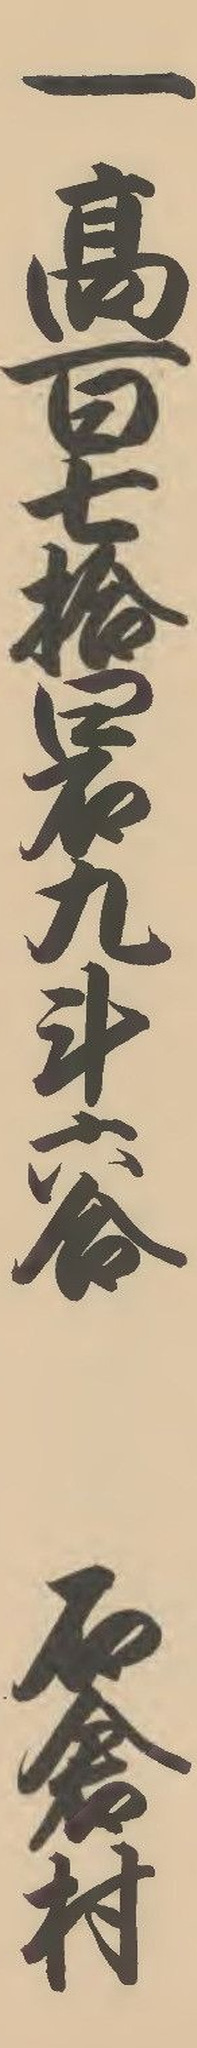一髙百七拾四石九斗六合石倉村
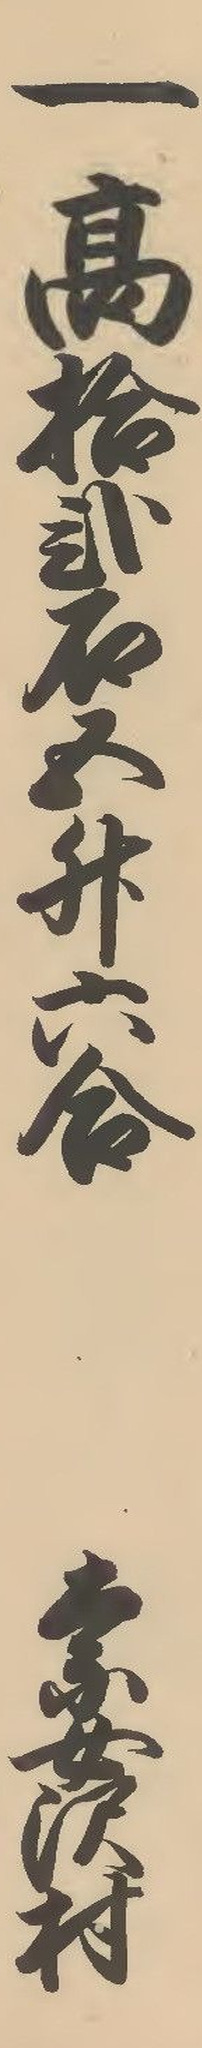一髙拾弐石五升六合奈女沢村
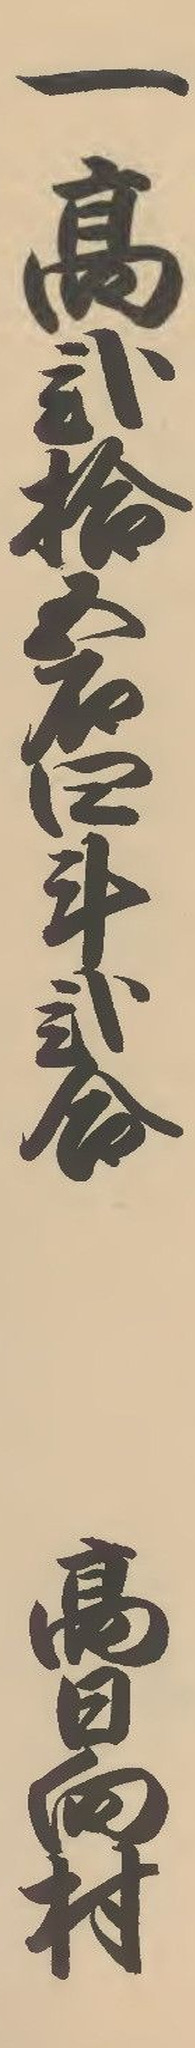一髙弐拾五石四斗弐合髙日向村
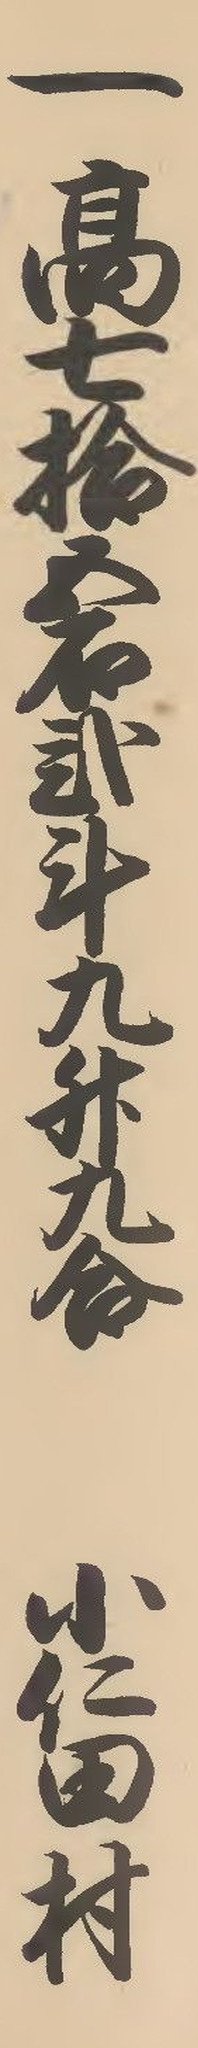一髙七拾五石弐斗九升九合小仁田村
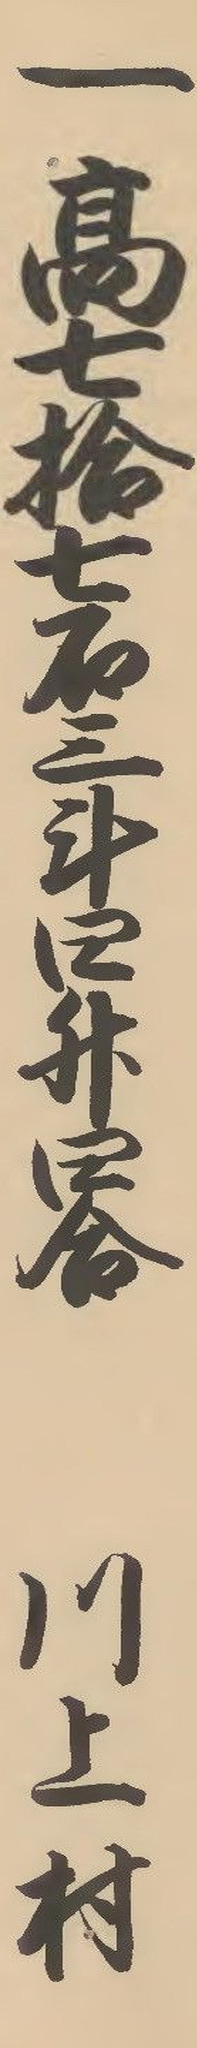一髙七拾七石三斗四升四合川上村
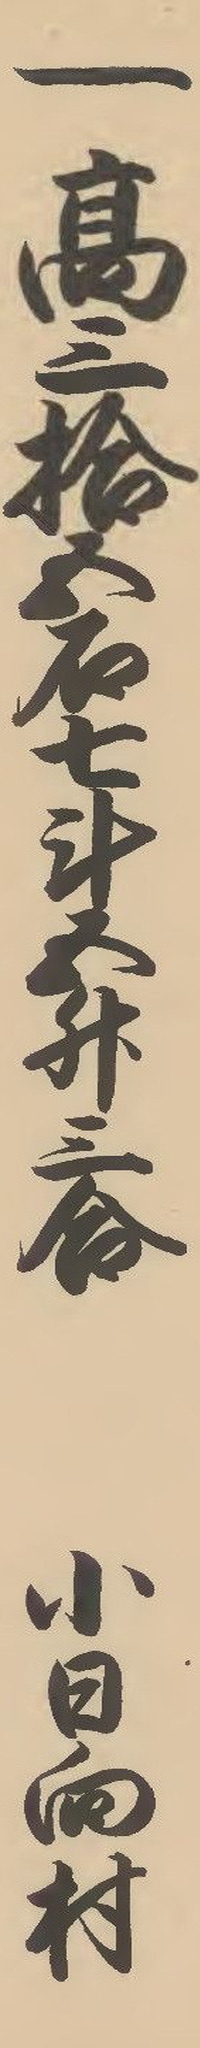一髙三拾五石七斗五升三合小日向村
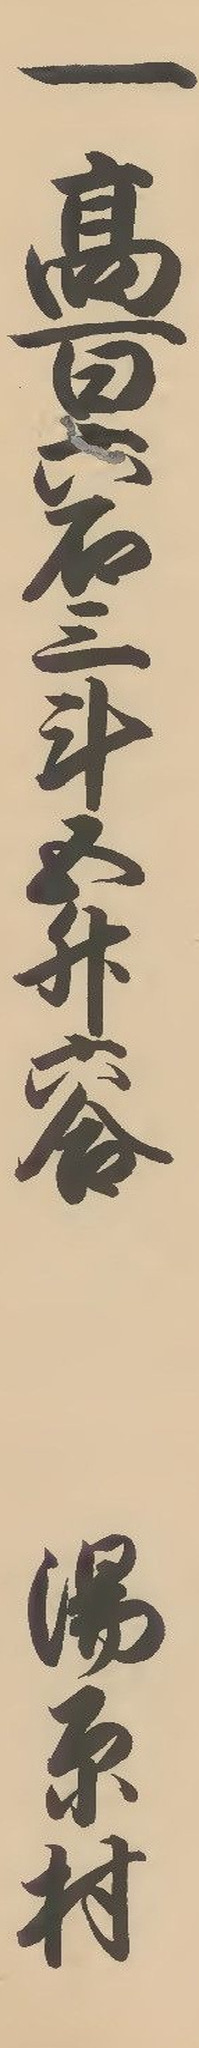一髙百六石三斗五升六合湯原村
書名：上野国郷帳
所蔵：国立公文書館 National Archives of Japan
